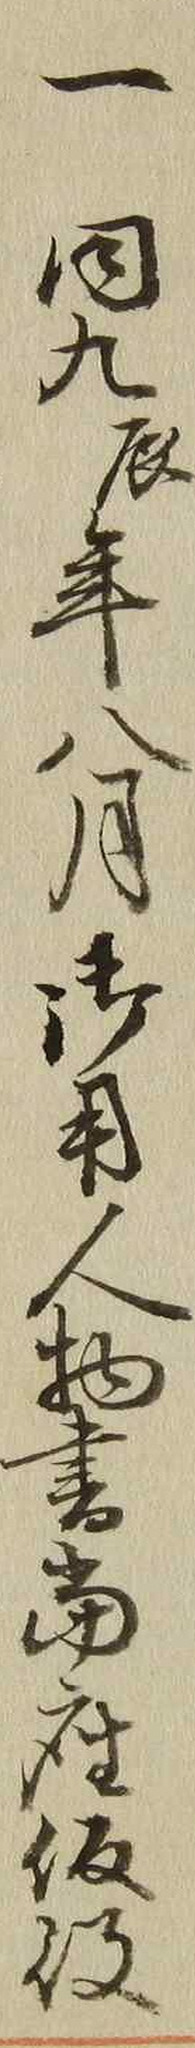一同九辰年八月御用人物書当座仮役
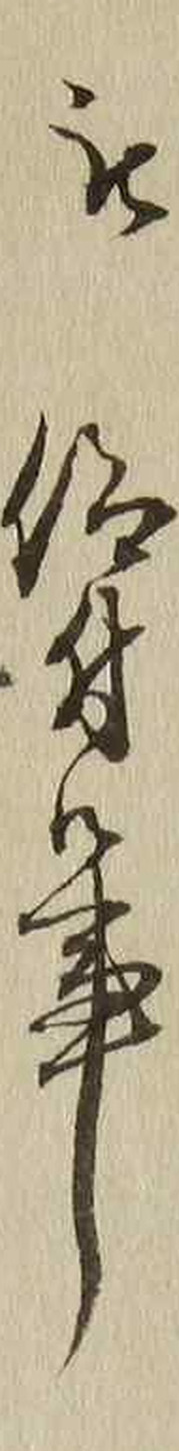被仰付候事
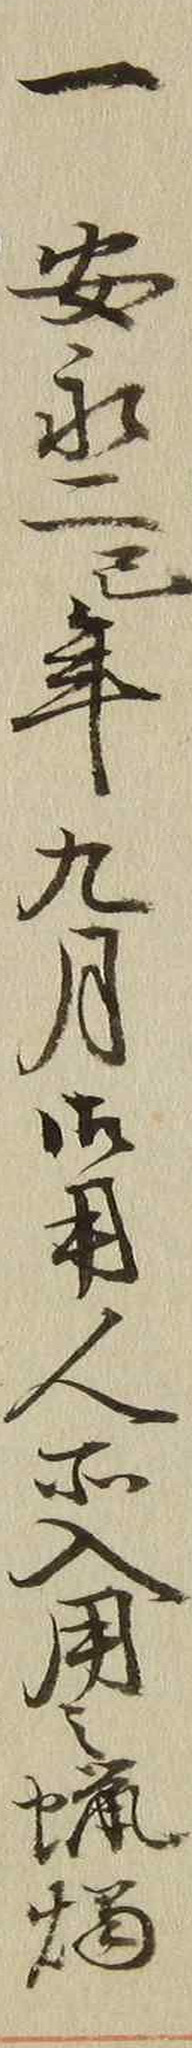一安永二巳年九月御用人所入用之蠟燭
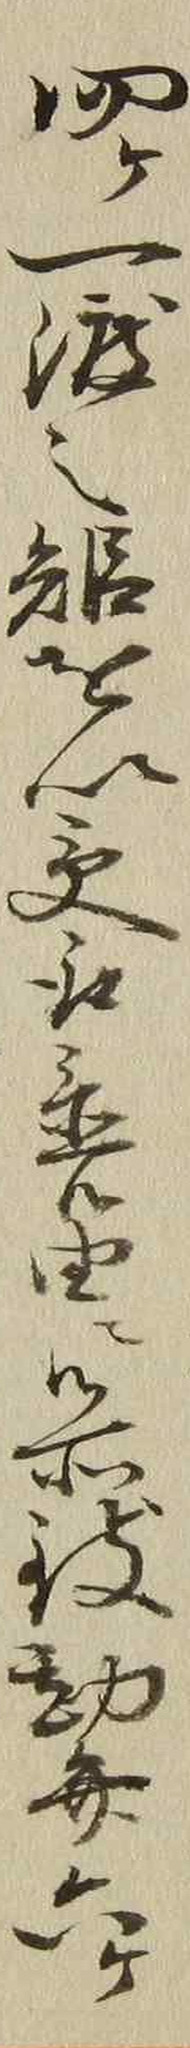四ケ一渡之矩を以受取置候由ニ候所致勘弁六ケ
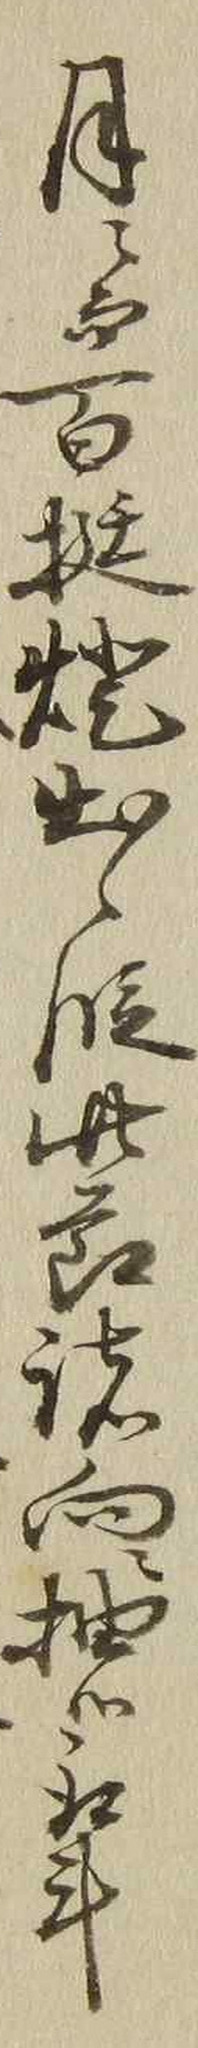月ニ而百挺燈出候段此節諸向ニ抽候取斗
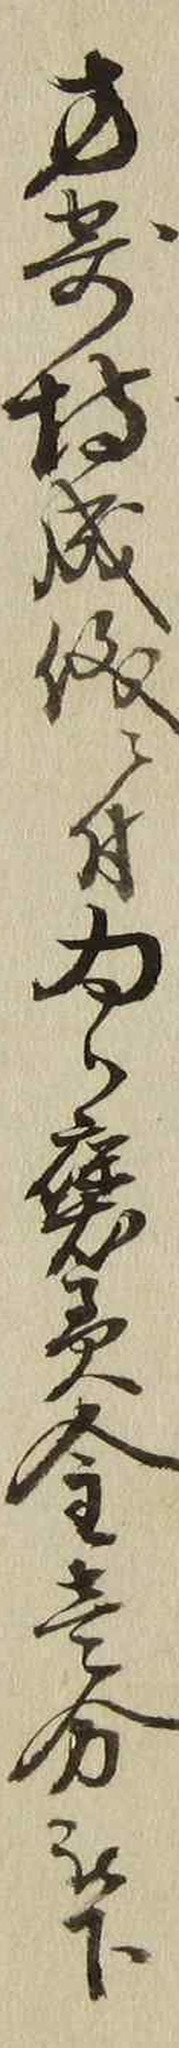方奇特成偽ニ付為御褒美綿金壱分被下
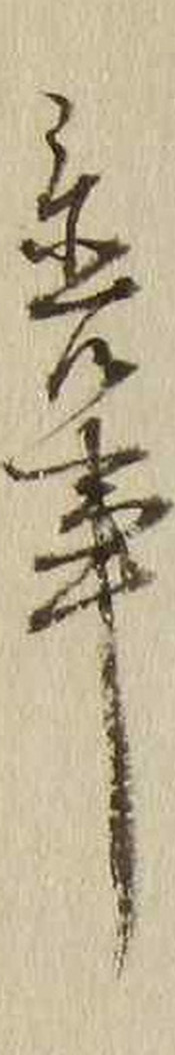置候事
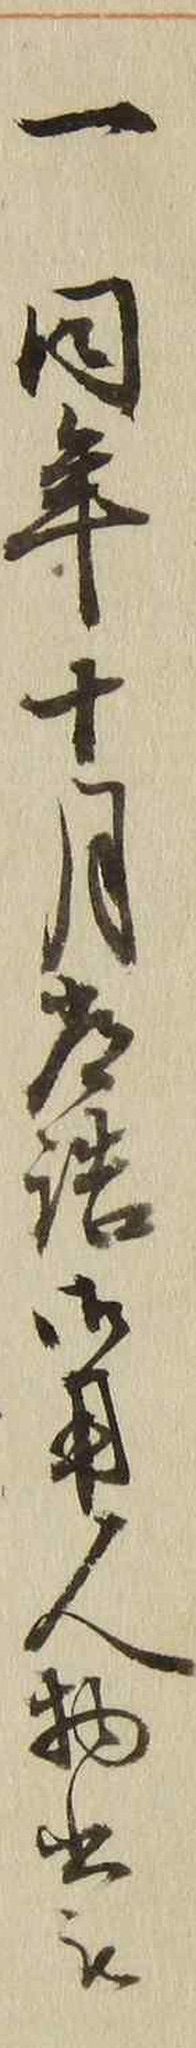一同年十月常詰御用人物書被
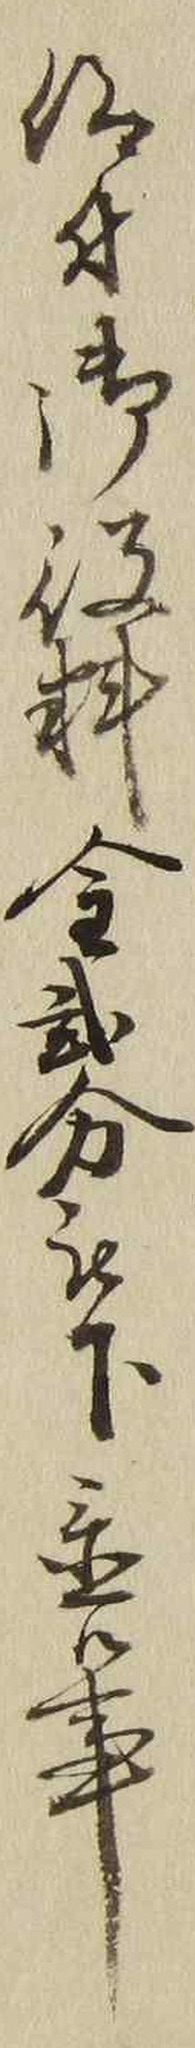仰付お御役料金弐分被下置そ候事

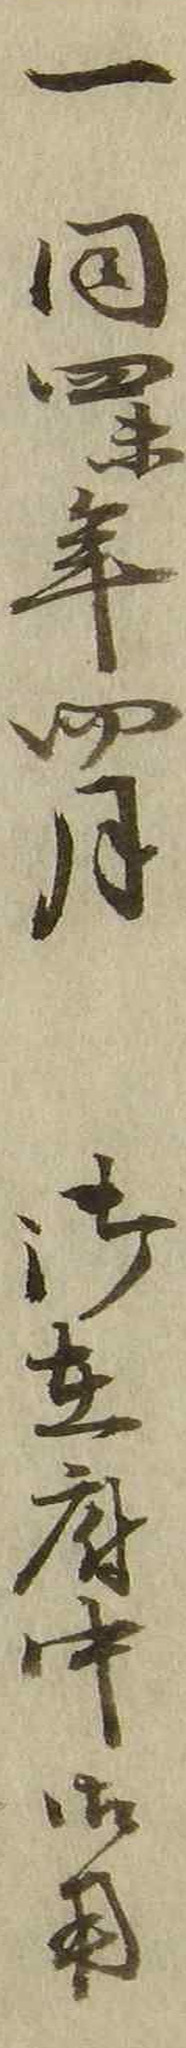一同四未年四月御在府中御用
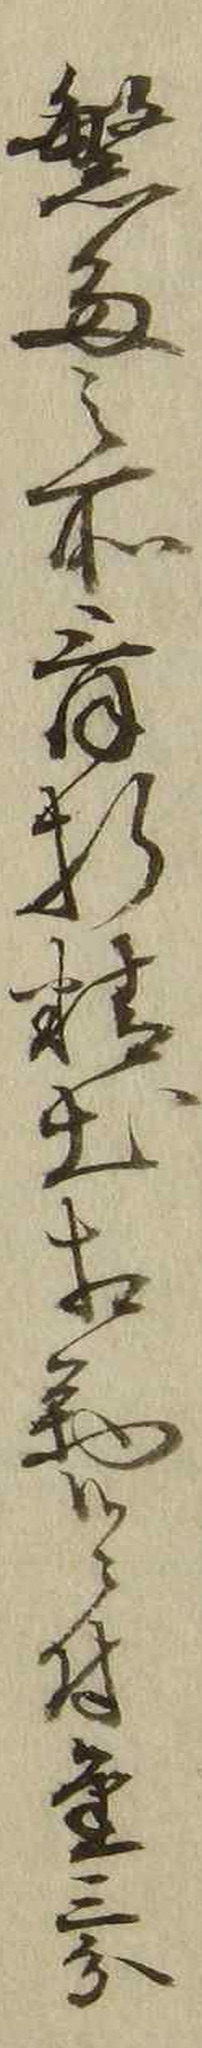繫多之所骨折精出相勤候ニ付金三分
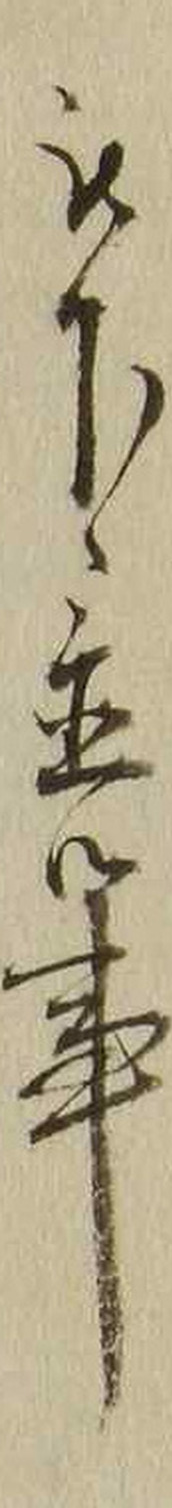被下置候事
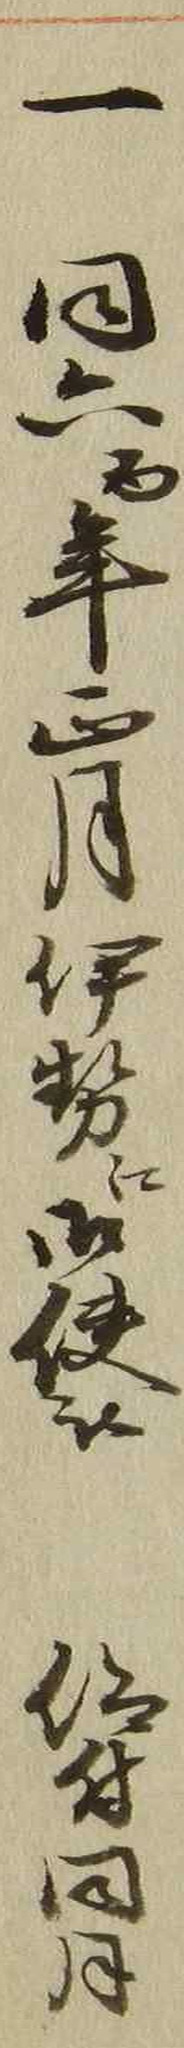一同六酉年正月伊勢江御使被仰付同月
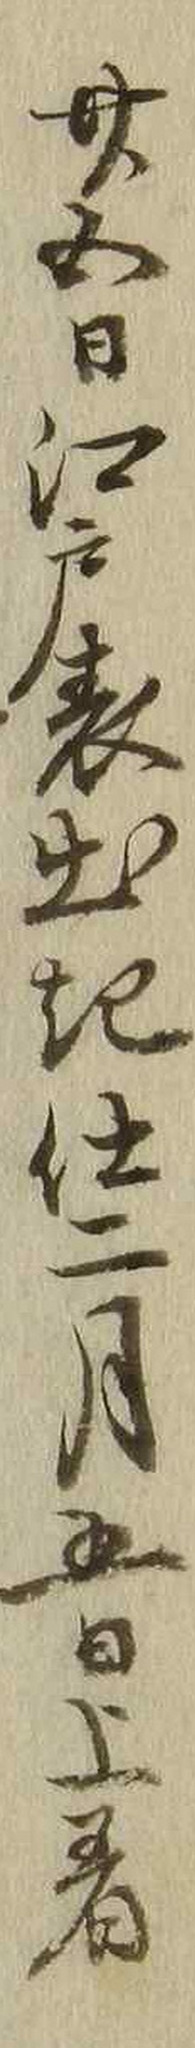廿五日江戸表出起仕二月五日上着
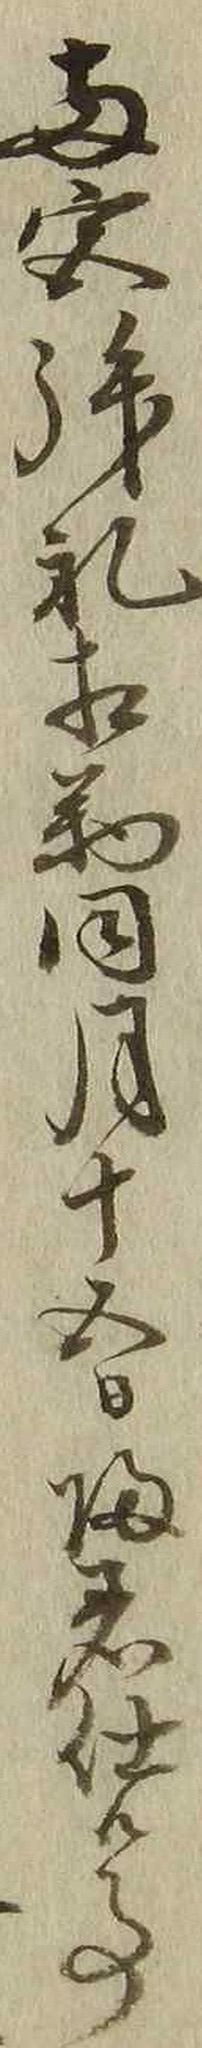両宮拝礼相勤同月十五日帰着仕候事
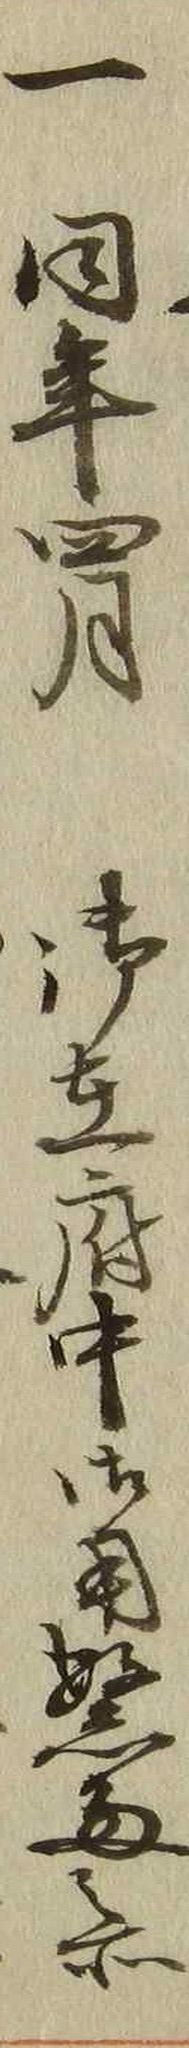一同年四月御在府中御用繫多之所
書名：諸士系譜　巻之64　と之部7
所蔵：会津若松市立会津図書館
